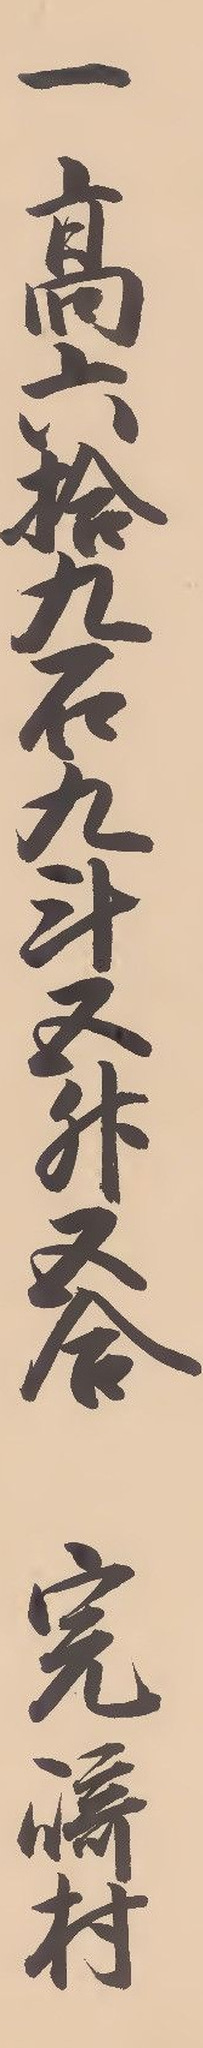一髙六拾九石九斗五升五合完崎村

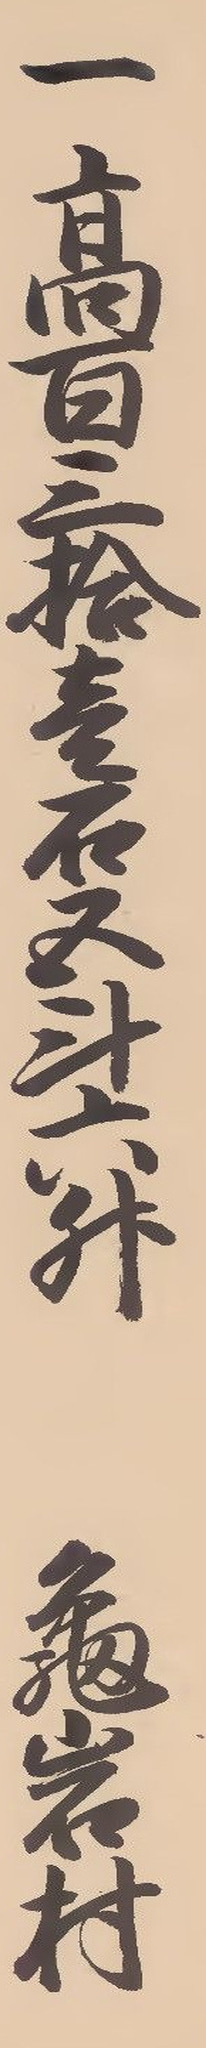一髙百三拾壱石五斗六升龜岩村
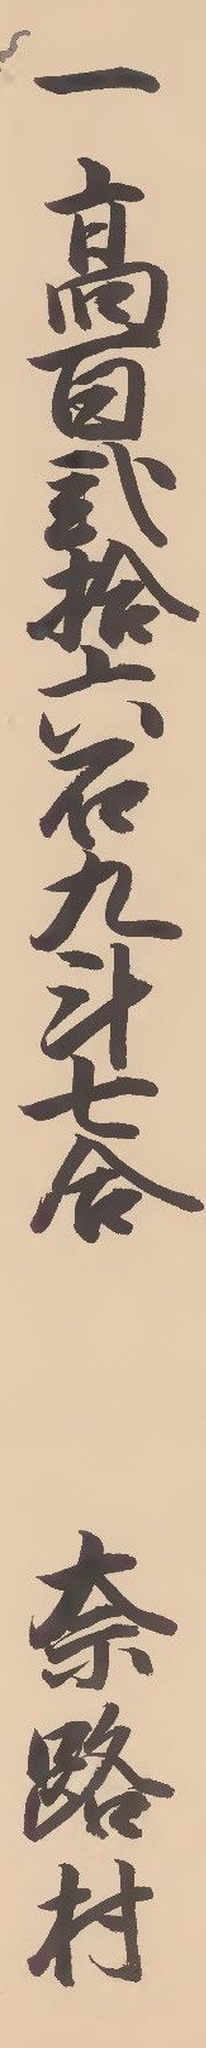一髙百弐拾六石九斗七合奈路村
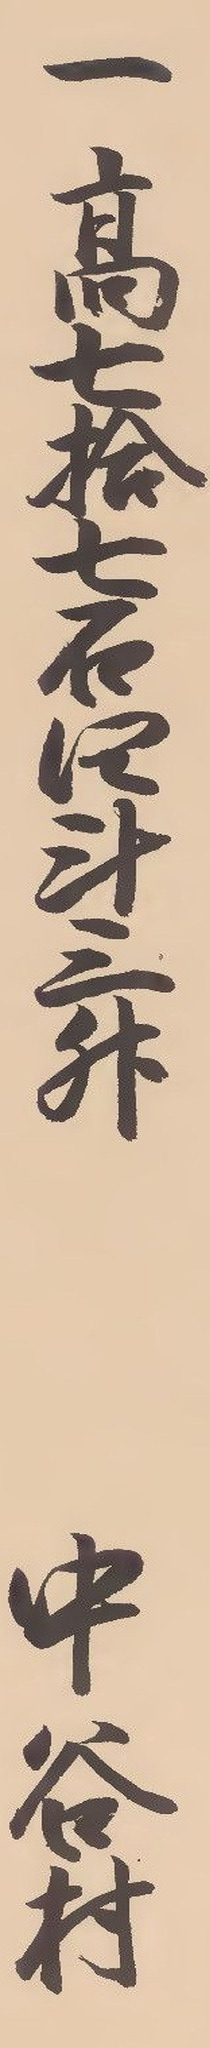一髙七拾七石四斗三升中谷村
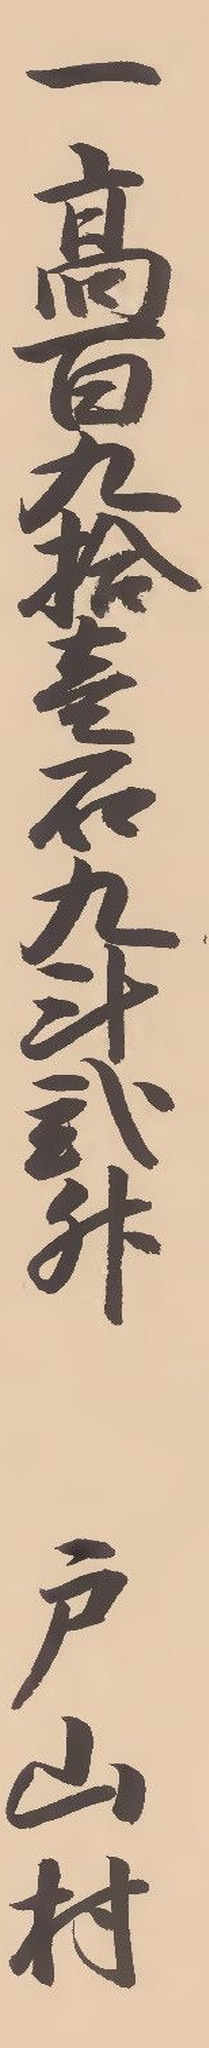一髙百九拾壱石九斗弐升戸山村
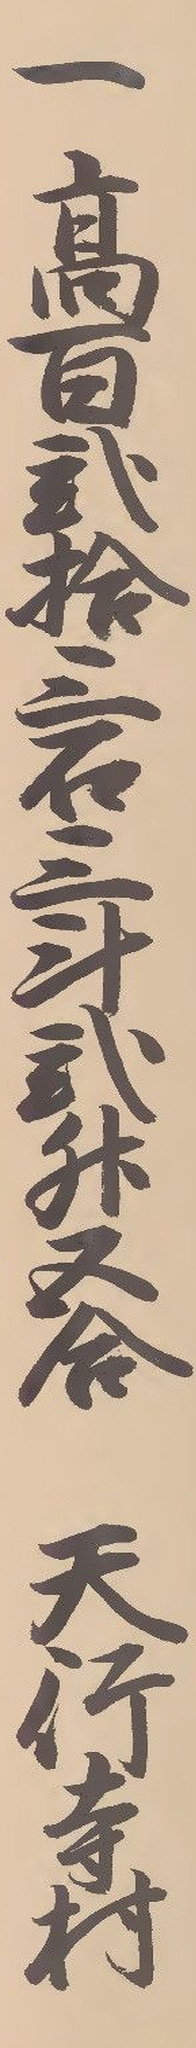一髙百弐拾三石三斗弐升五合天行寺村
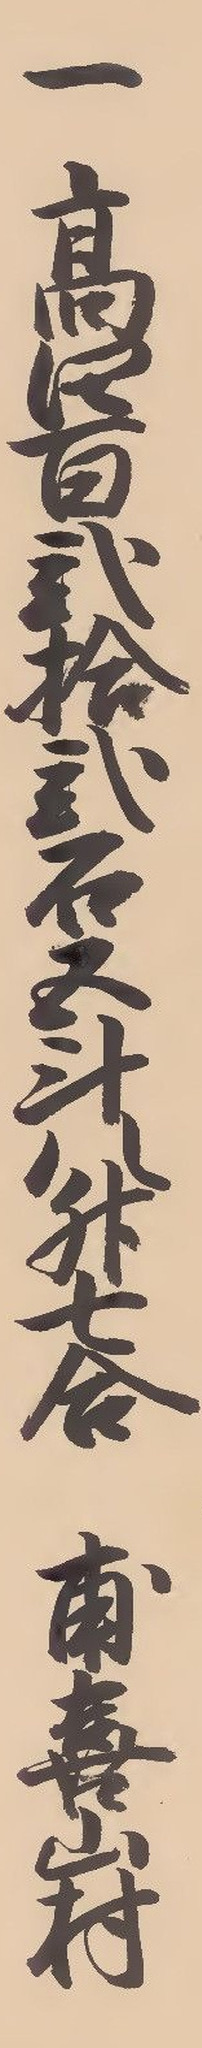一髙四百弐拾弐石五斗八升七合甫喜山村
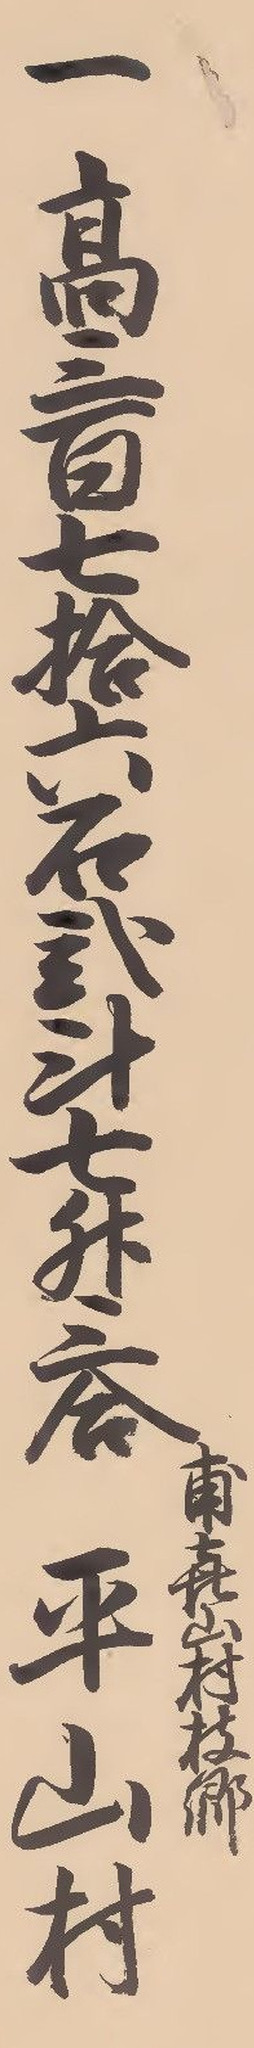一髙三百七拾六石弐斗七升三合平山村
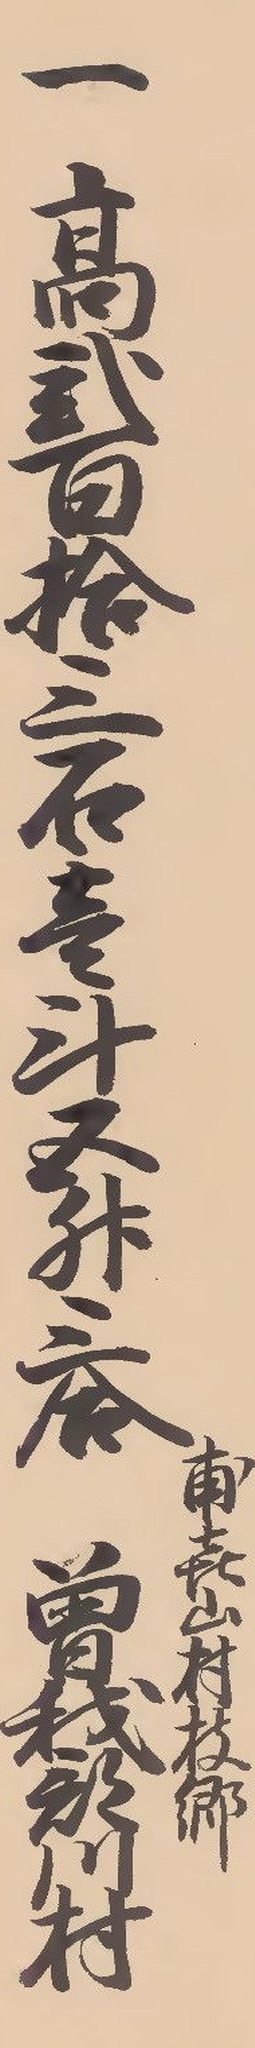一髙弐百拾三石壱斗五升三合曽我部川村

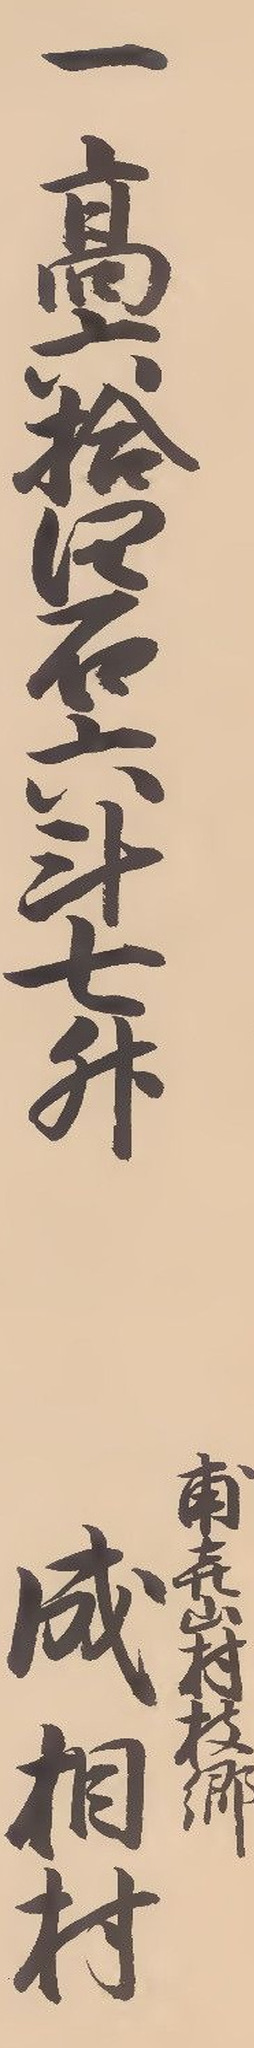一髙六拾四石六斗七升成相村
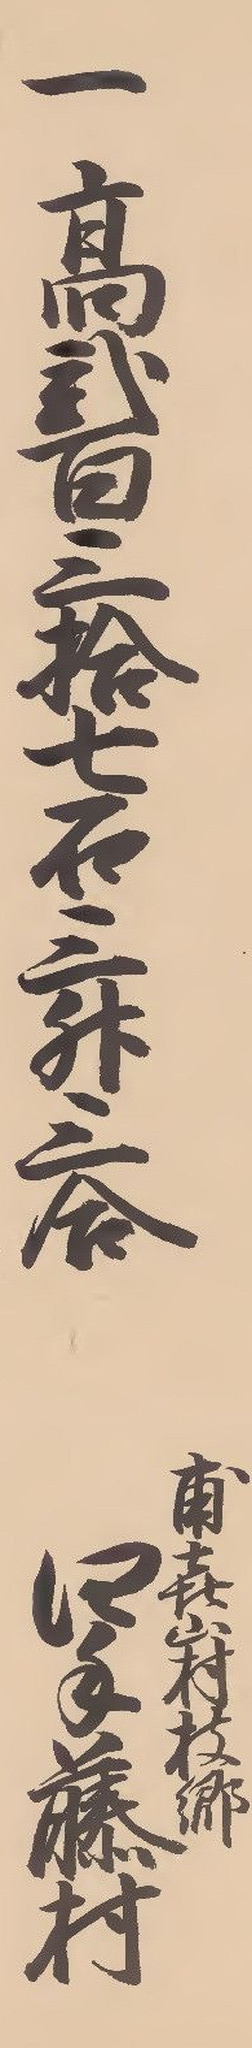一髙弐百三拾七石三升三合四手藤村
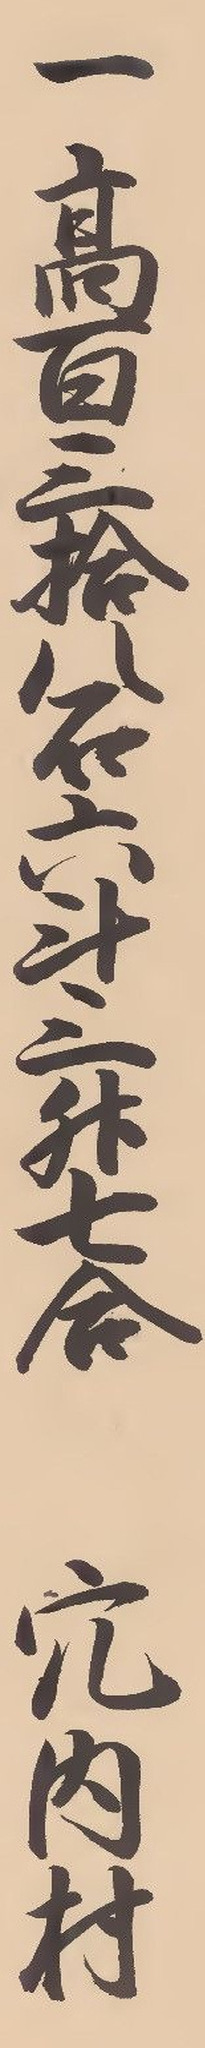一髙百三拾八石六斗三升七合穴内村
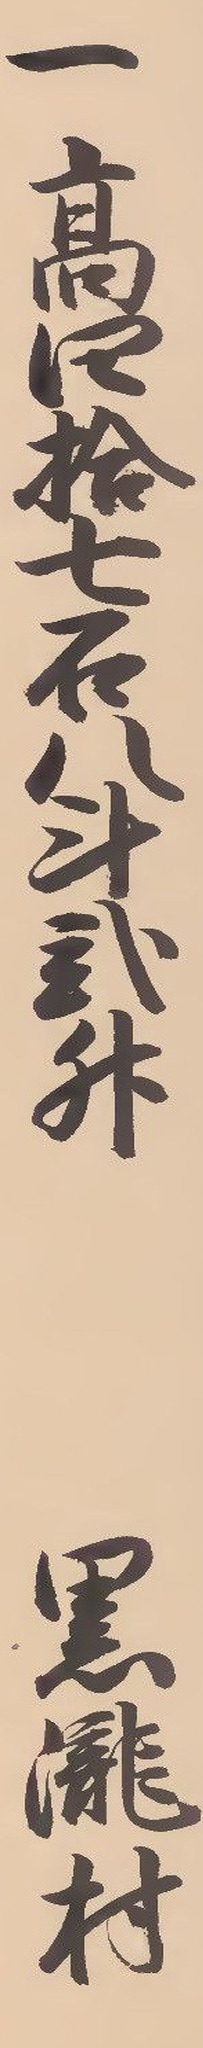一髙四拾七石八斗弐升黑瀧村
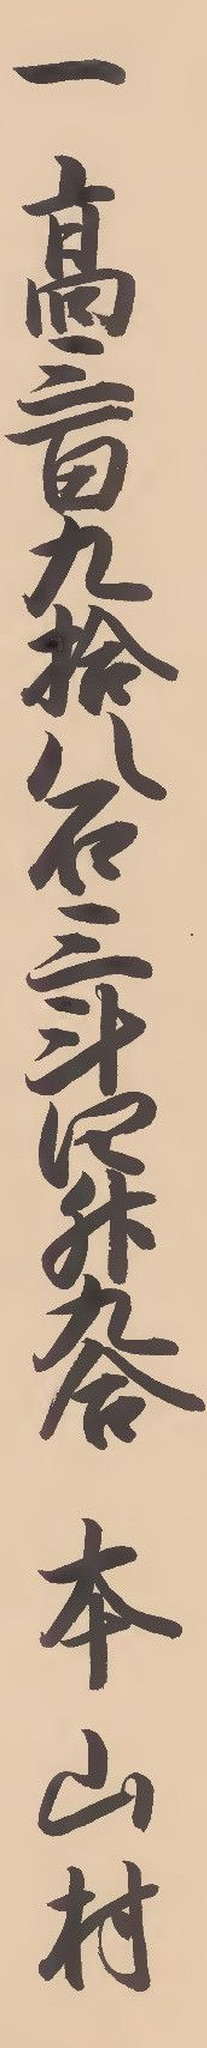一髙三百九拾八石三斗四升九合本山村
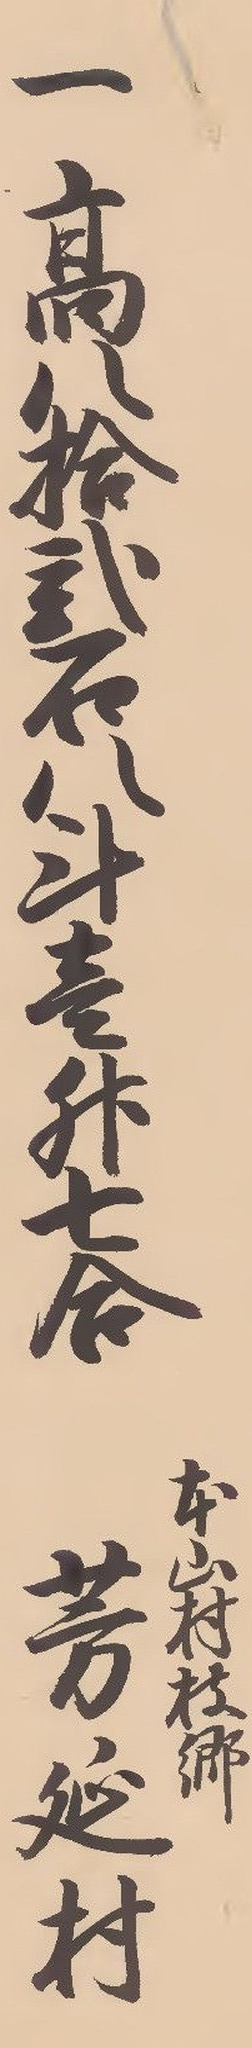一髙八拾弐石八斗壱升七合芳延村
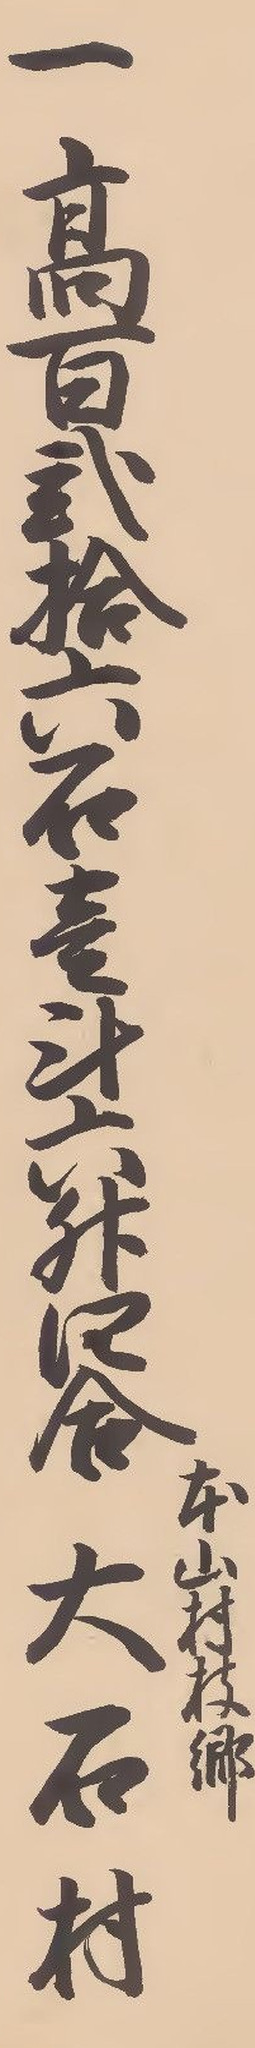一髙百弐拾六石壱斗六升四合大石村
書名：土佐国郷帳
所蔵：国立公文書館 National Archives of Japan
